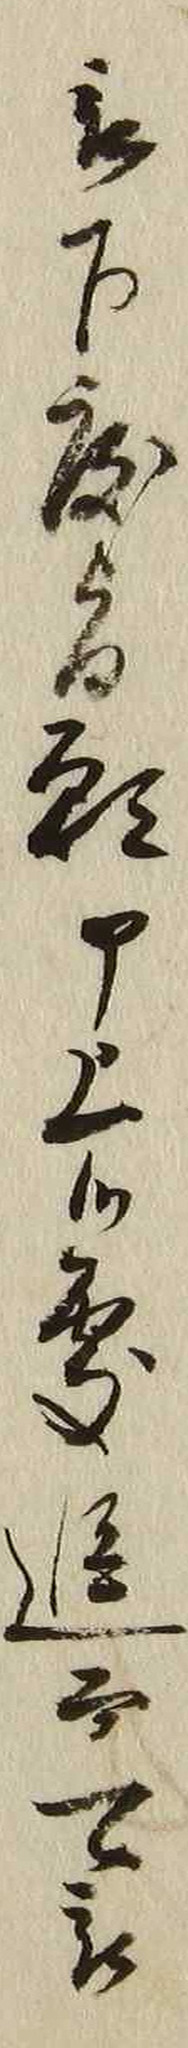被下度旨願申上候処追而可被
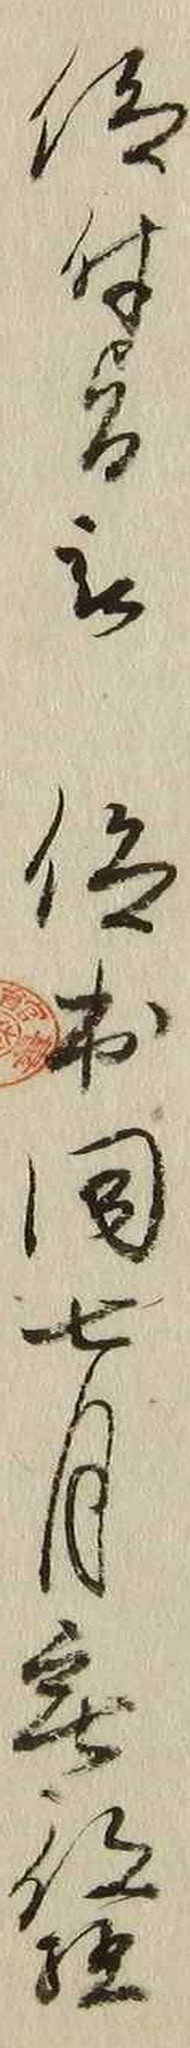仰付旨被仰出同七月無役組
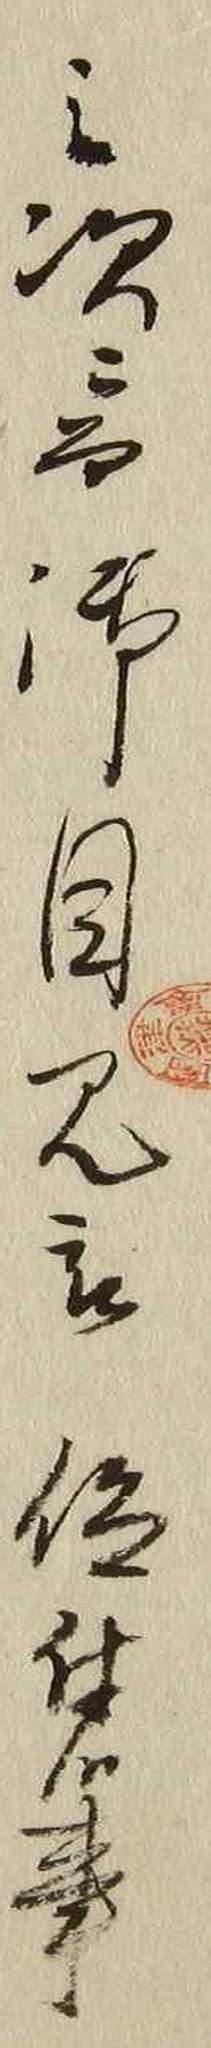之次ニ而御目見被仰付候事
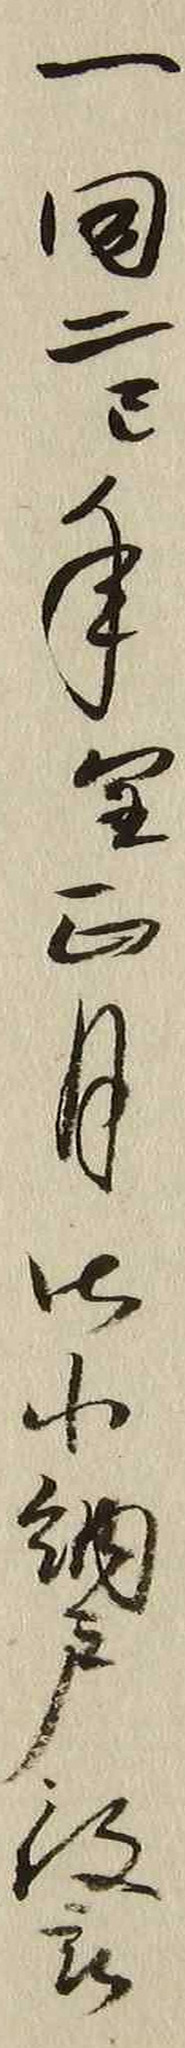一同二巳年閏正月御小納戸役被
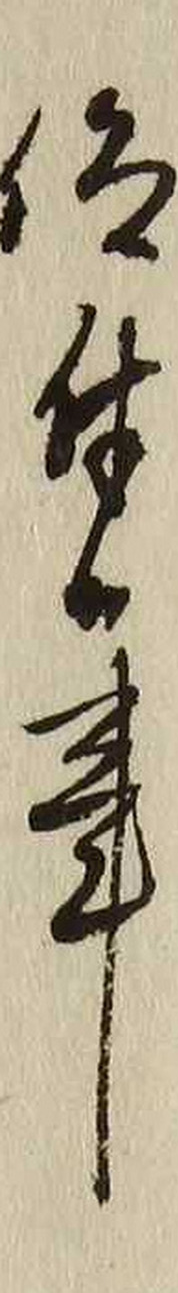仰付候事
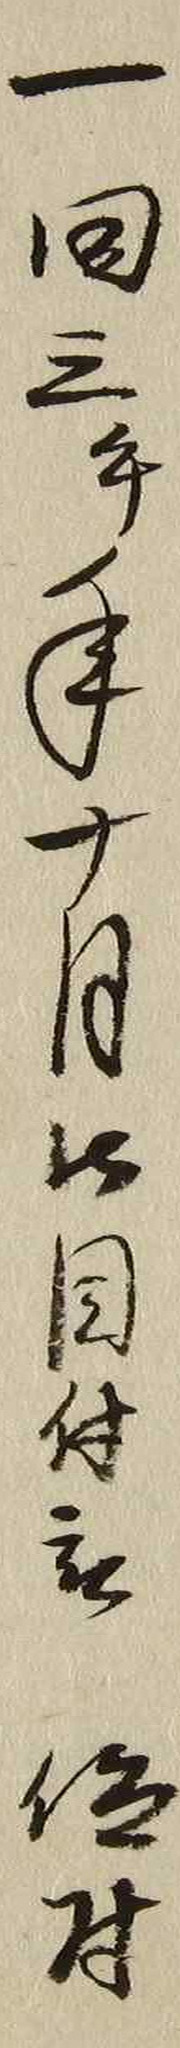一同三午年十月御目付被仰付
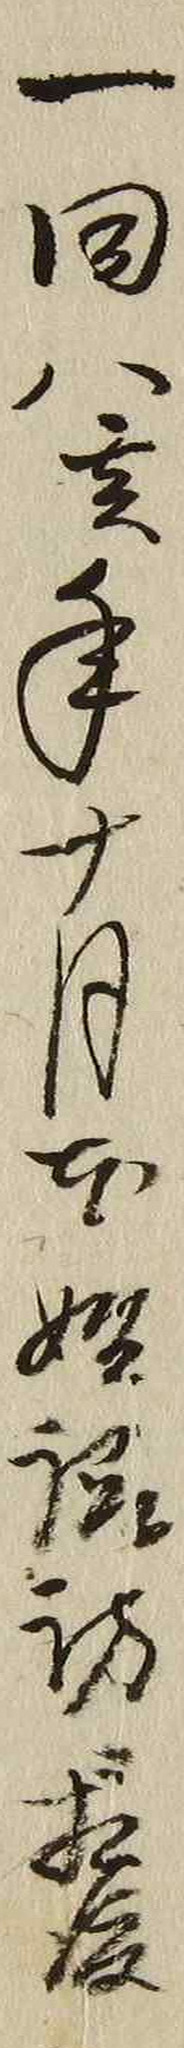一同八亥年十月本姓諏訪ニ相渡
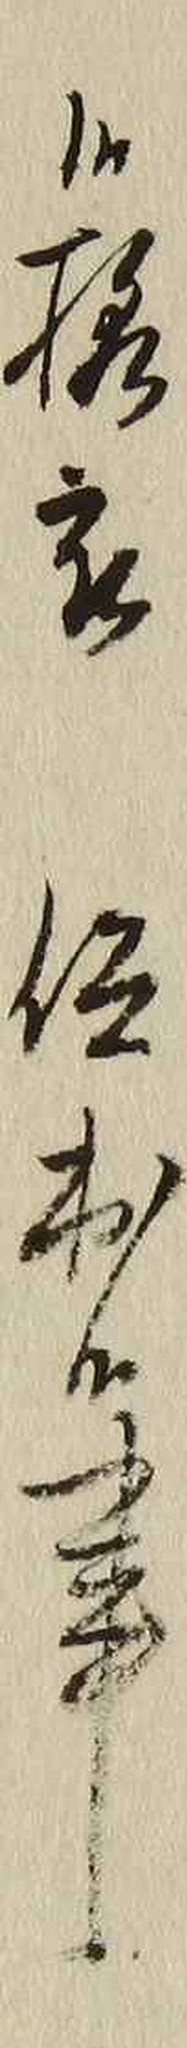候様被仰出候事
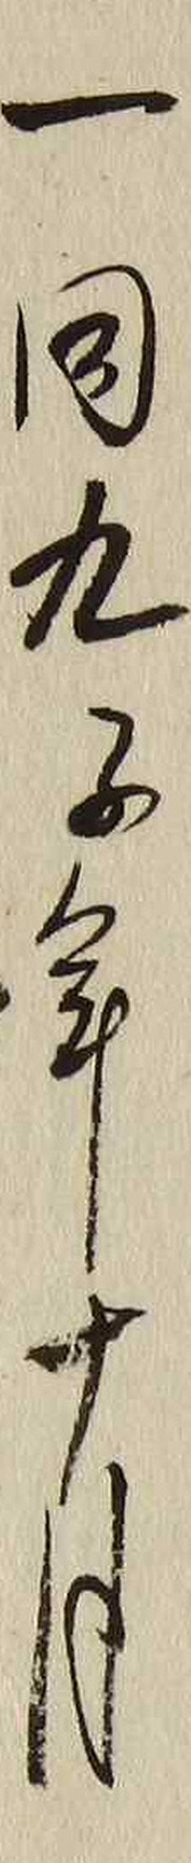一同九子年十月
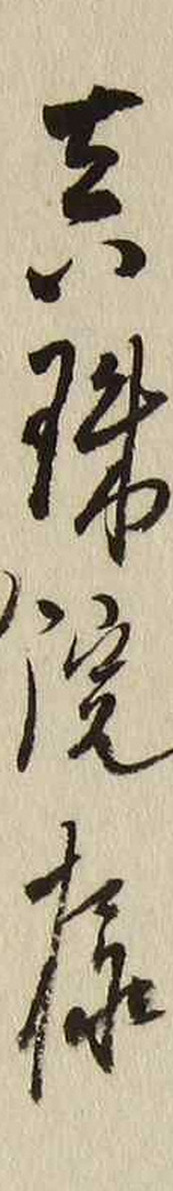真珠院様
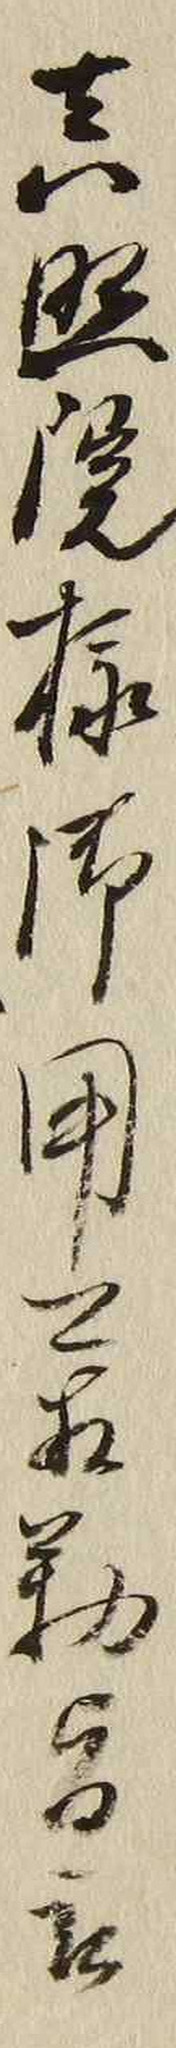真照院様御用可相勤旨被
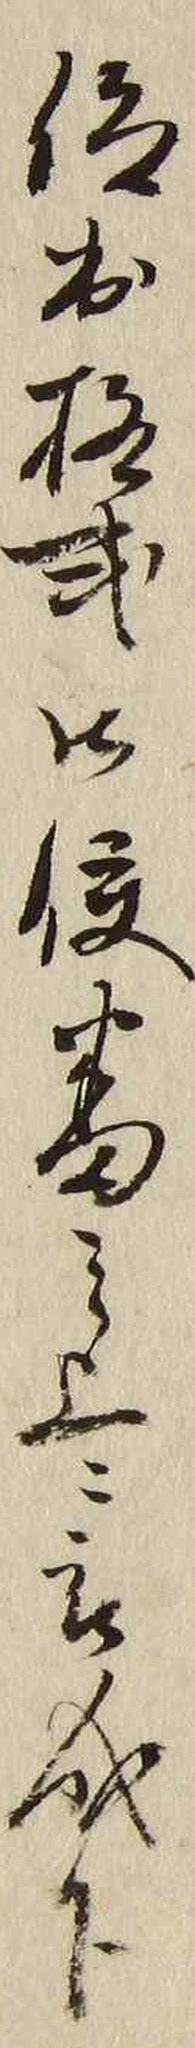仰出格式御使番之上ニ被成下
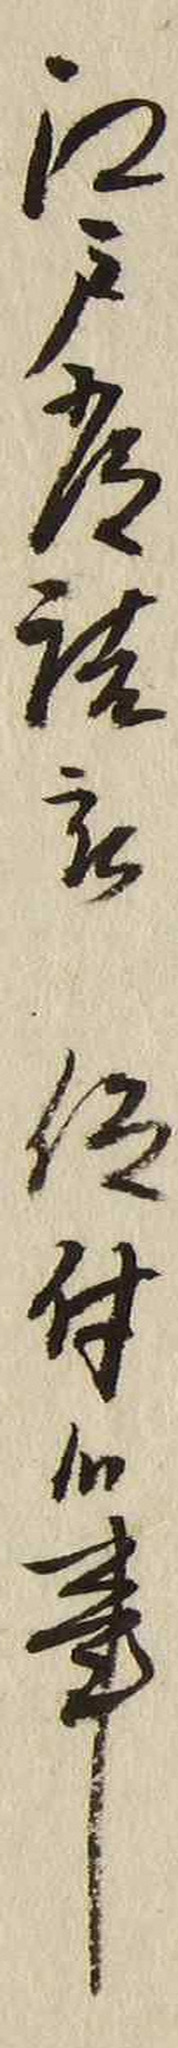江戸常詰被仰付候事

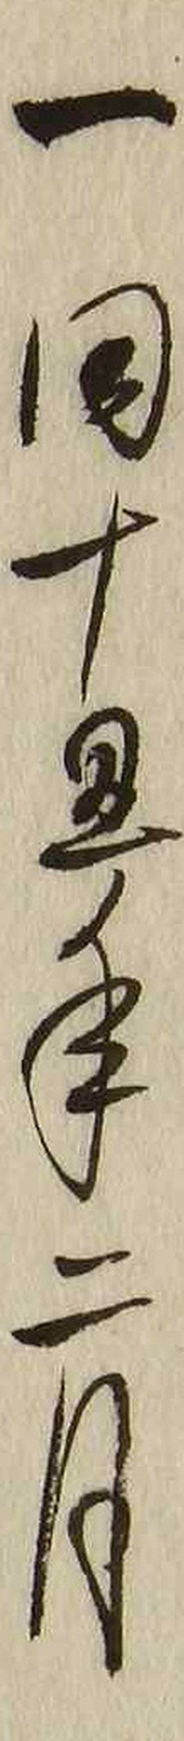一同十丑年二月
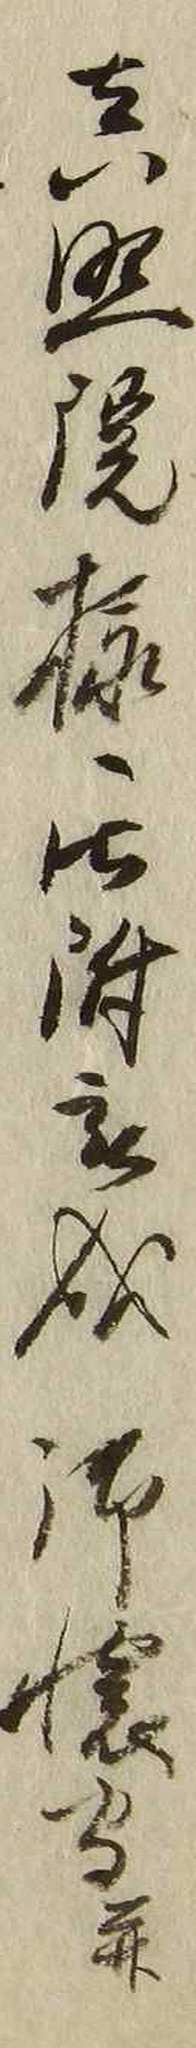真照院様へ御附被成御懐守并
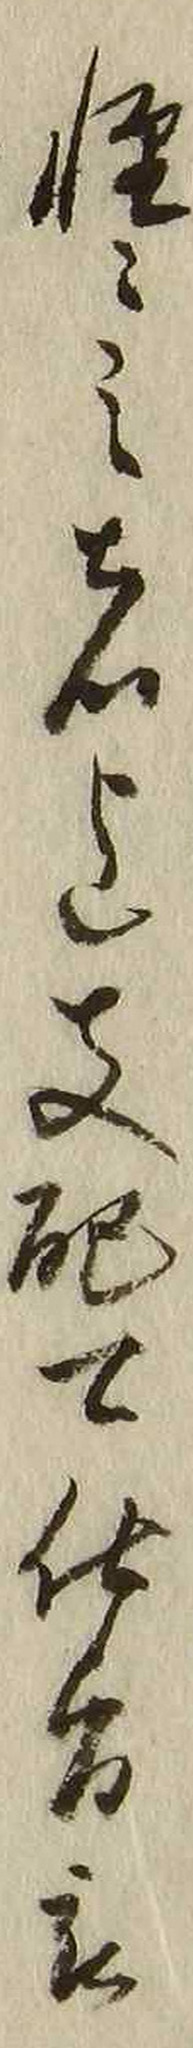軽々之者迄支配可仕旨被
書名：諸士系譜　巻之351　す之部1
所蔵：会津若松市立会津図書館
